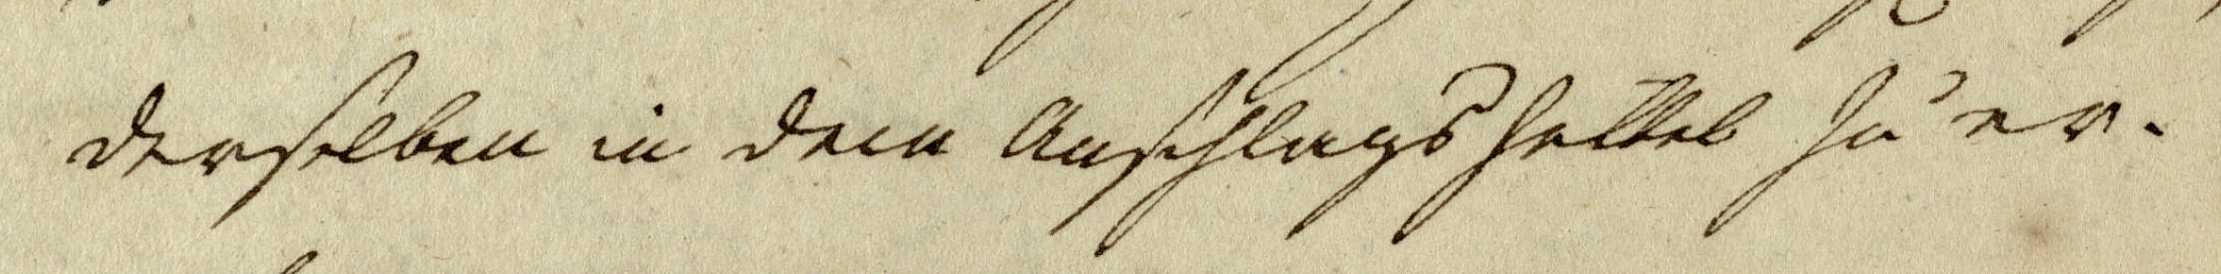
derselben in dem Anschlags Zettel zu er¬
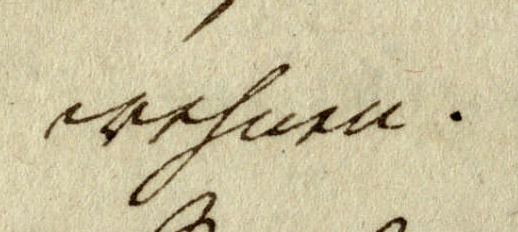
wehnen.
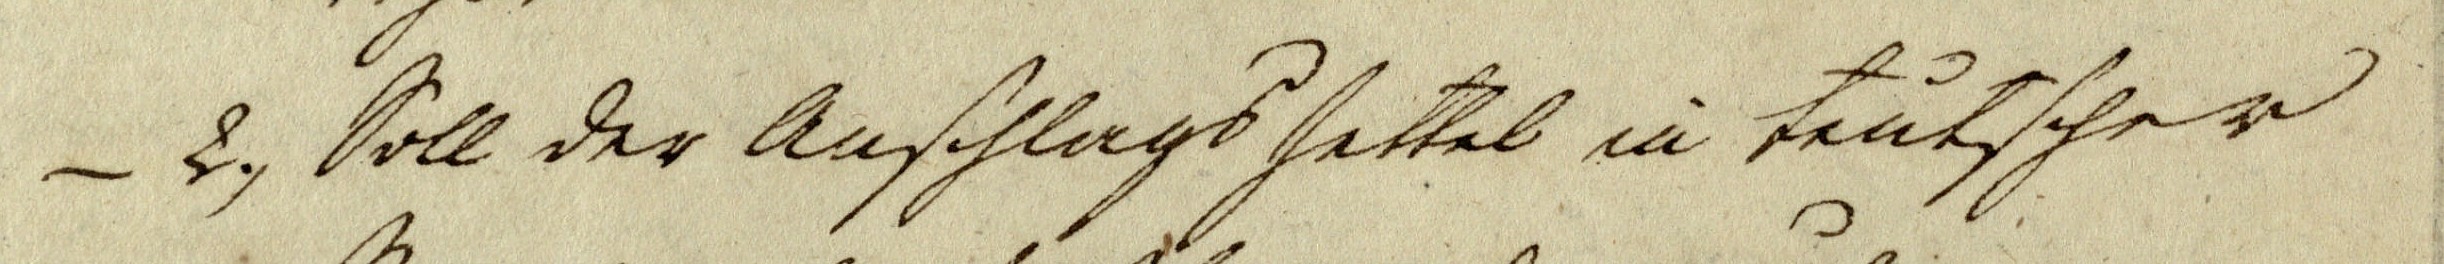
2., Soll der Anschlags Zettel in teutscher
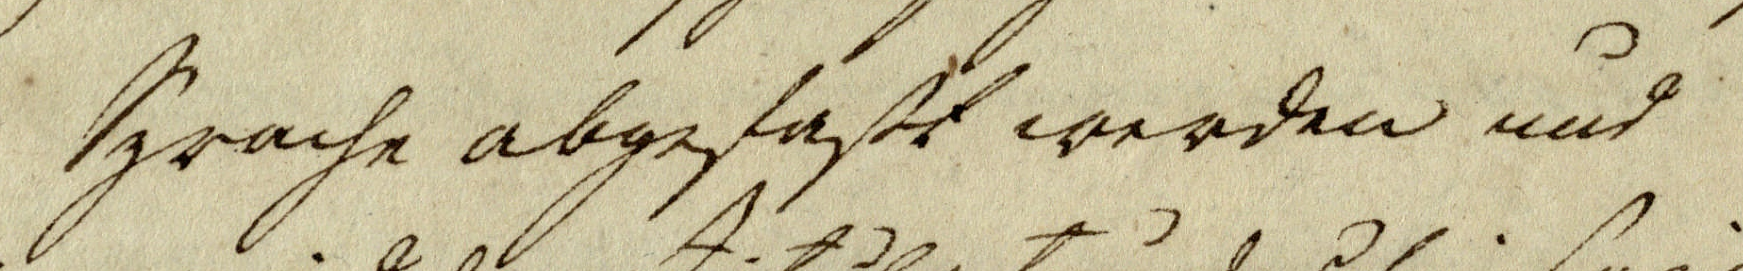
Sprache abgefaßt werden und
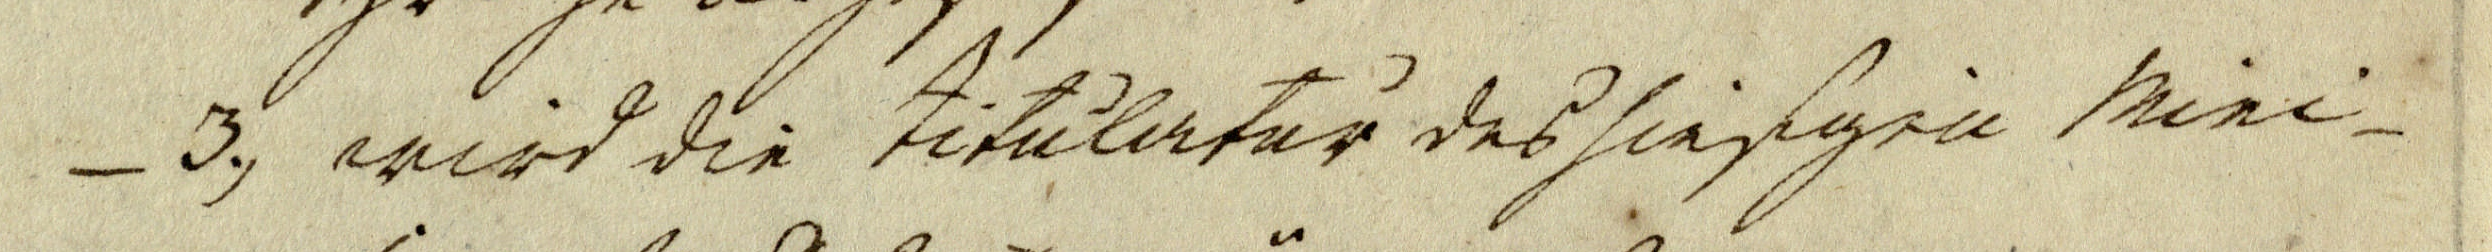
3., wird die Titulatur des hiesigen Mini¬
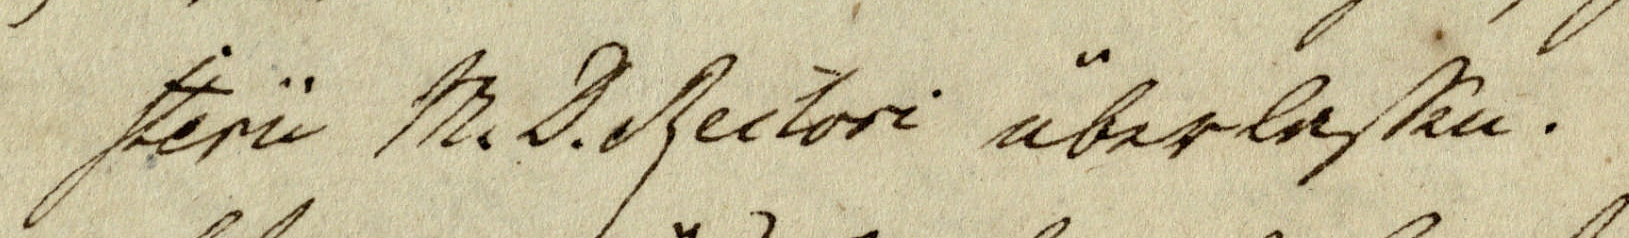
sterii M. D. Rectori überlassen.
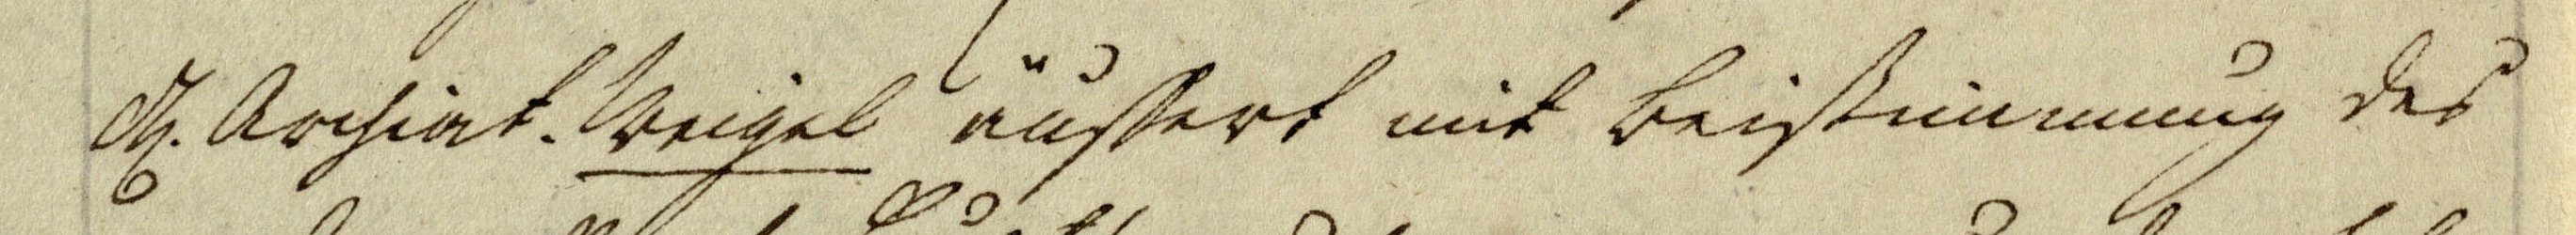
dh. Archiat. Weigel äussert mit Beistimmung des
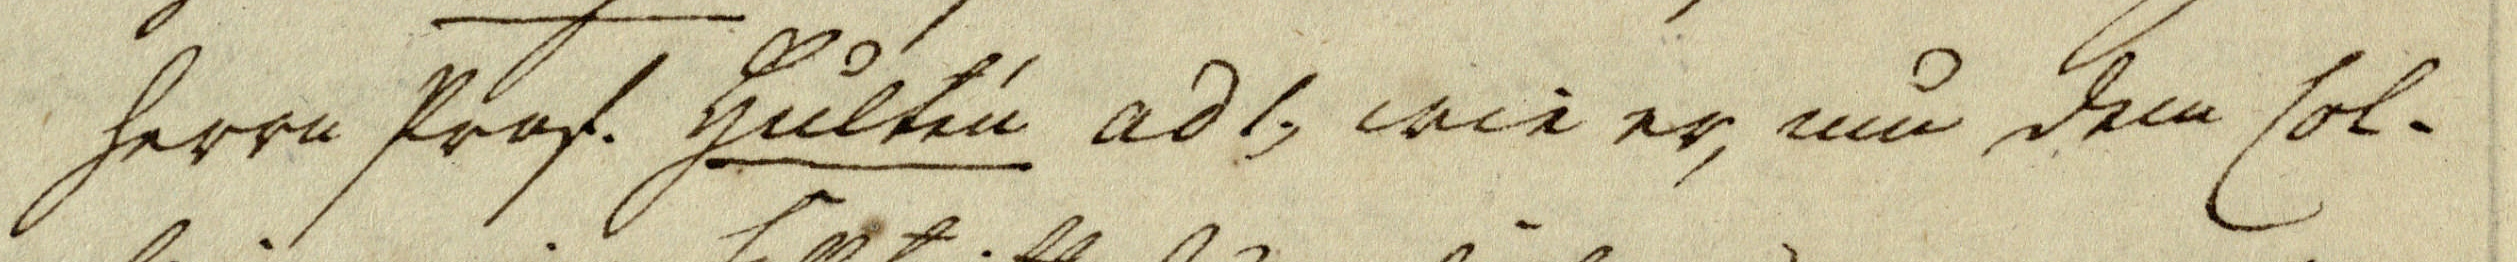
Herrn Prof. Hultén ad 1, wie er, um dem Col¬
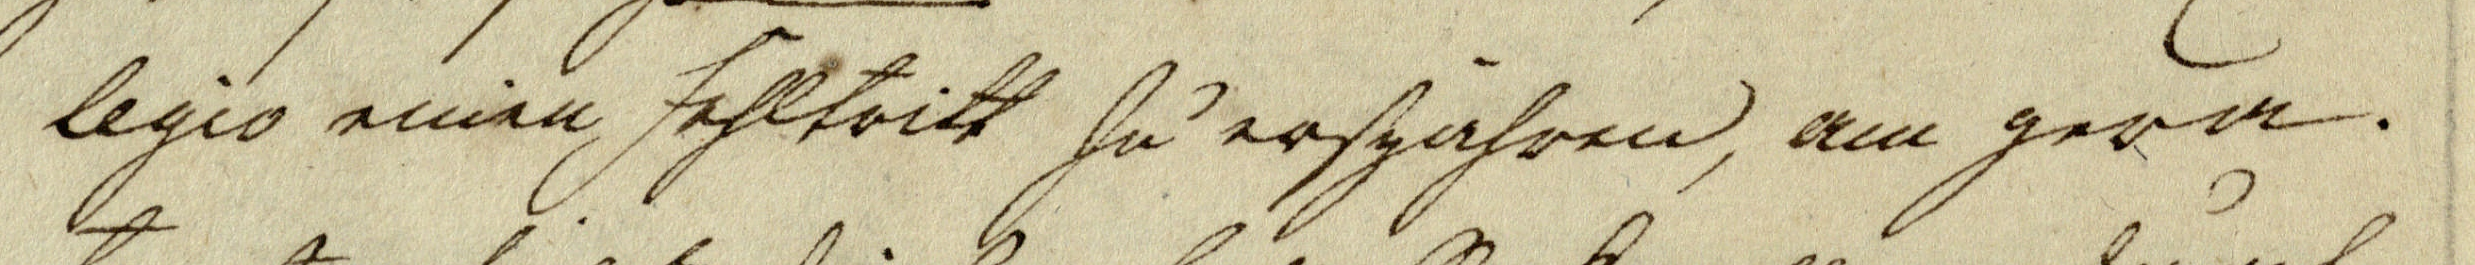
legio einen Fehltritt zu erspahren, am gera¬
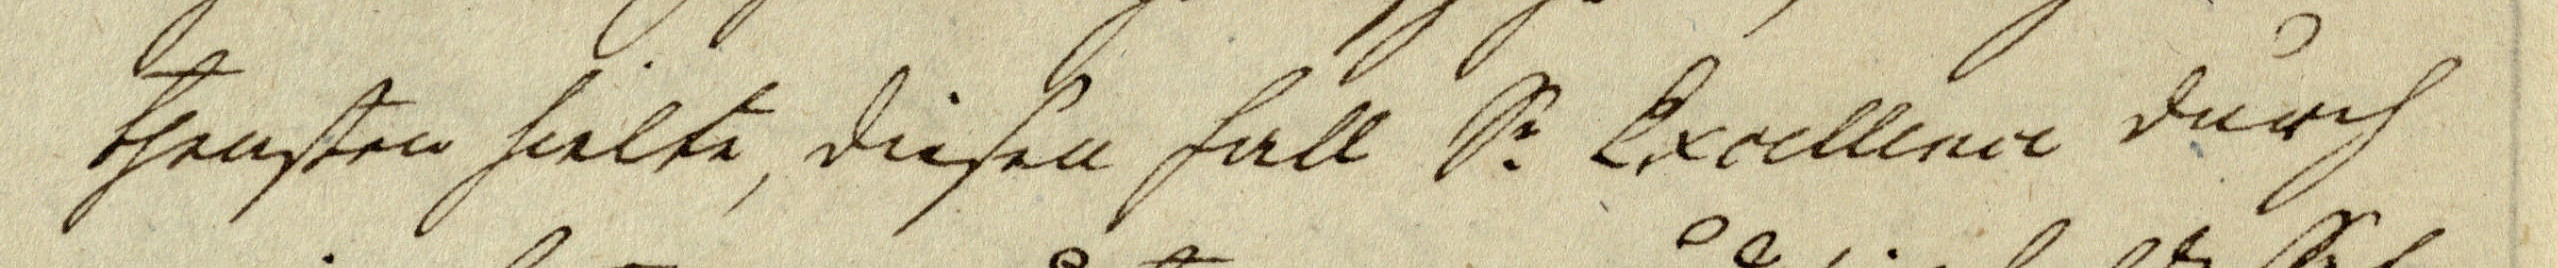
thensten hielte, diesen Fall Sr Excellence durch
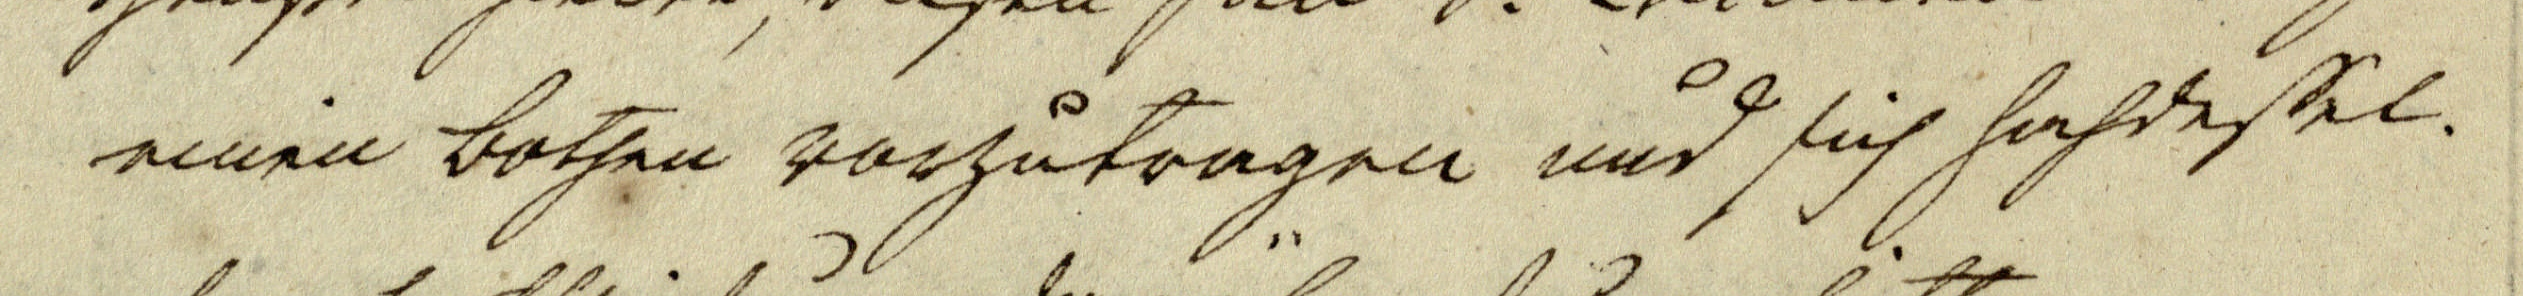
einen Bothen vorzutragen und sich hochdessel¬
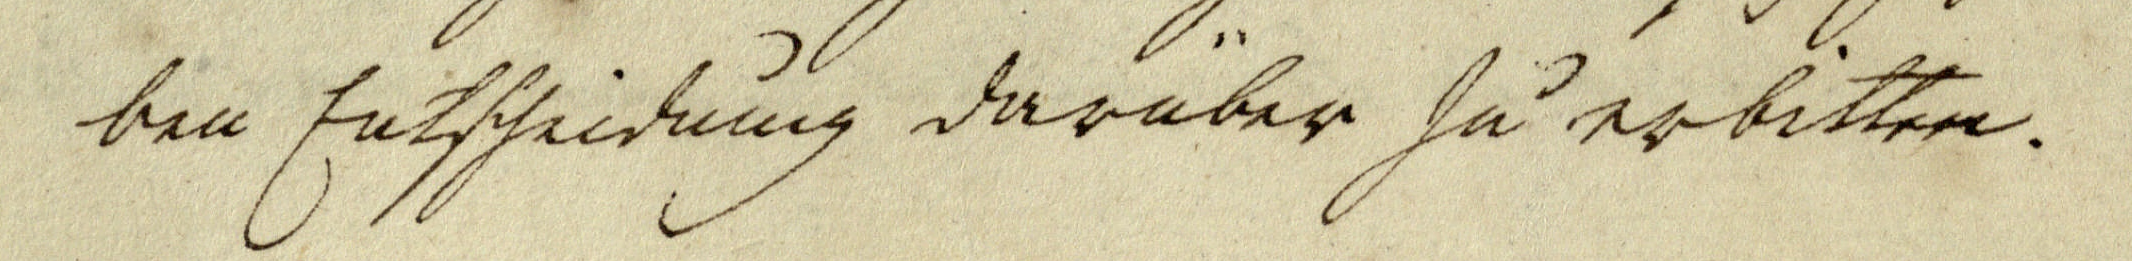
ben Entscheidung darüber zu erbitten.
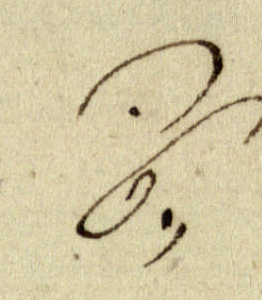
6.,
